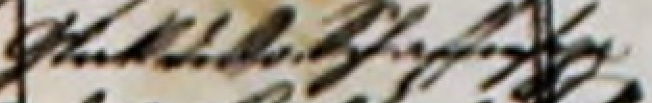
Glatt??? Schaffenberg
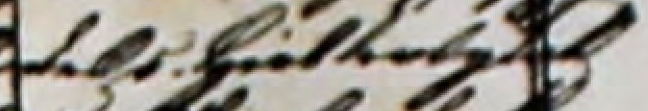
des 5. H???
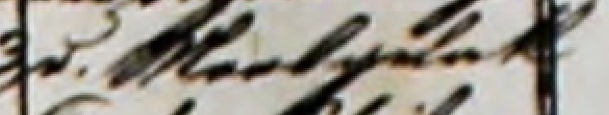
u. Maasgelak
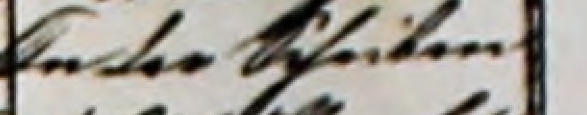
In der Scheiben
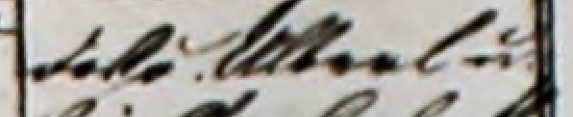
??? Albert u.
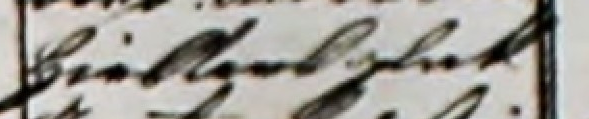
Hirstenschak
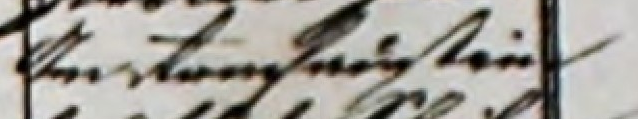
Instanffürstein
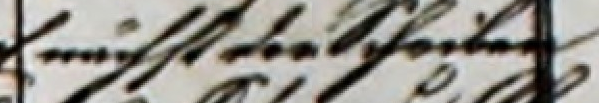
nächst den Scheiben
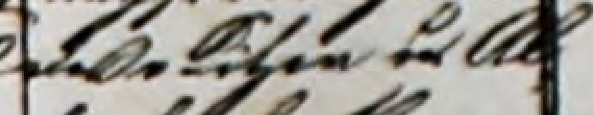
??? Kitzen der Al„
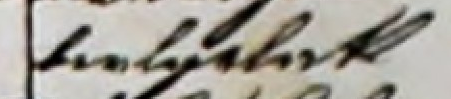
t???gelak
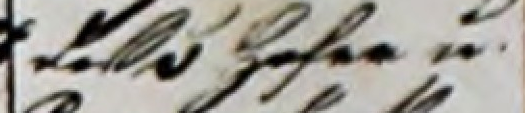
des v Hofer u.
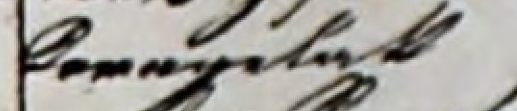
Pommgelak
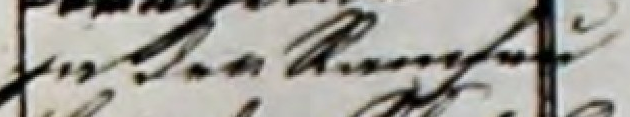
??? Ramsau
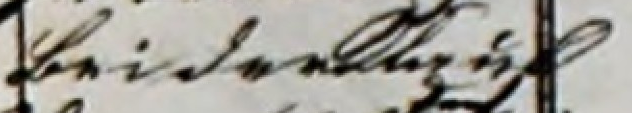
Bei der Klauf
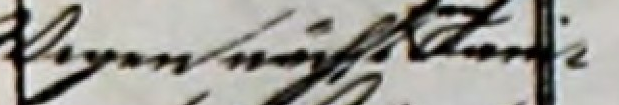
wegen nächst ???
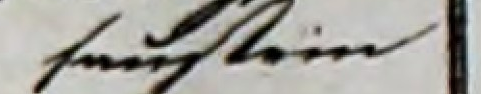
haustein
